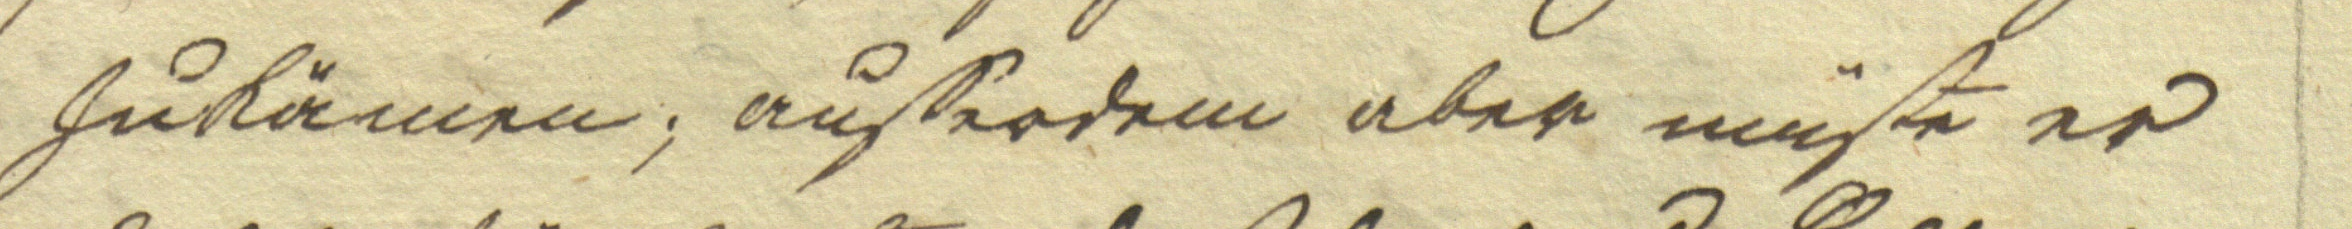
zukämen; ausserdem aber müßte er
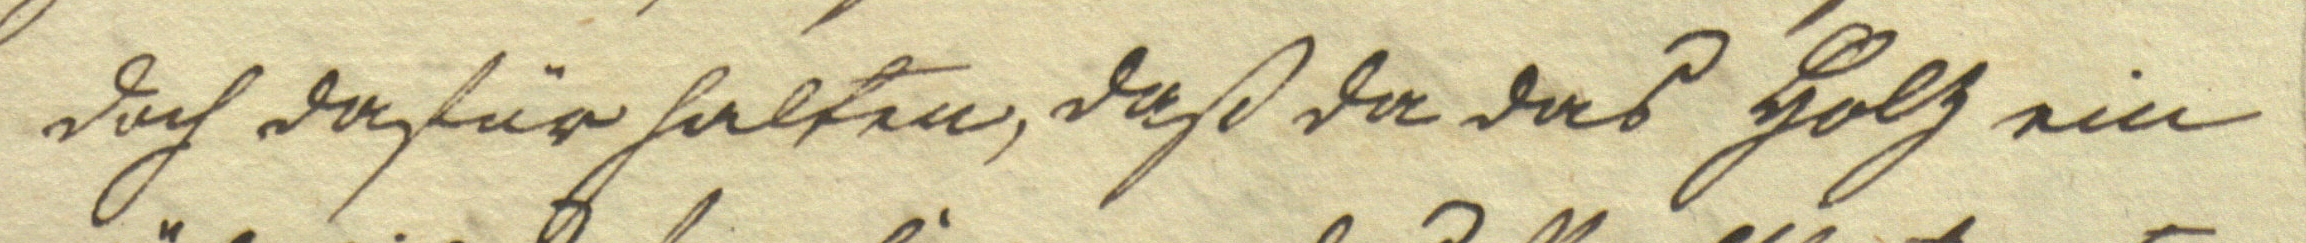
doch dafür halten, daß da das Holz ein
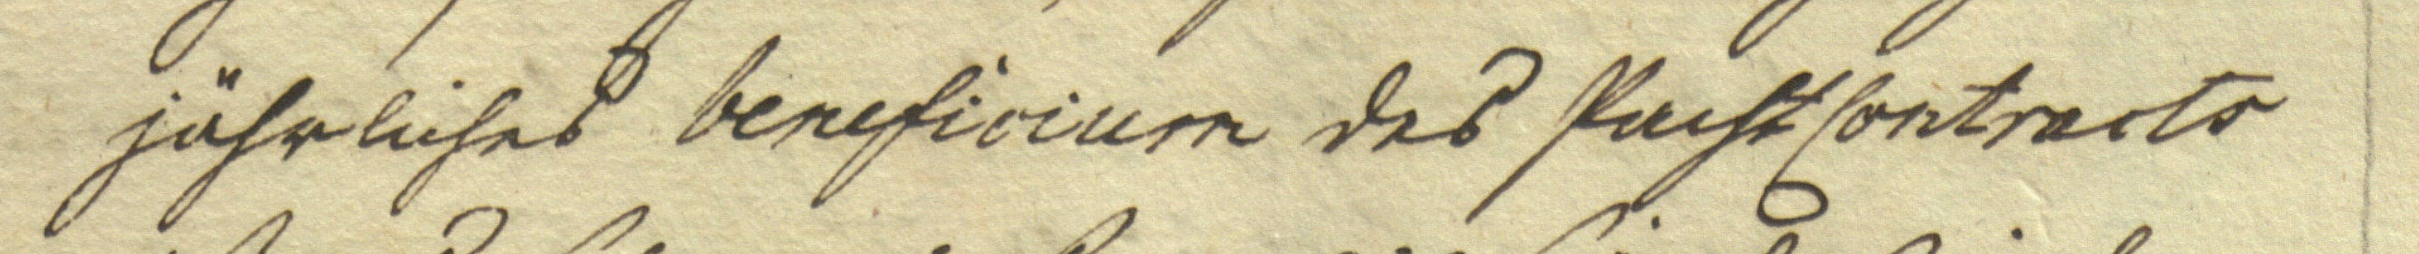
jährliches beneficium des Pacht Contracts
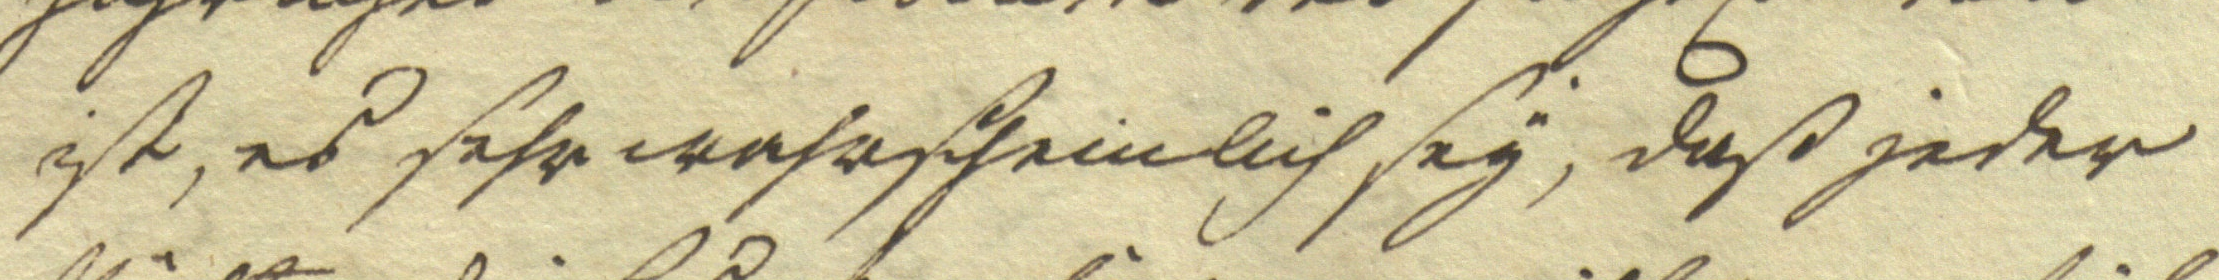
ist, es sehr wahrscheinlich seÿ, daß jeder
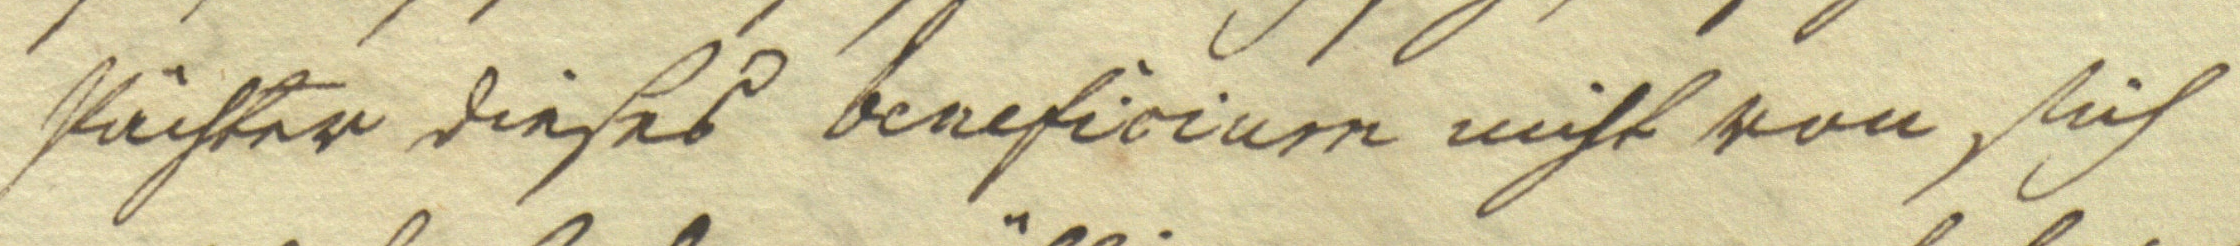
Pächter dieses beneficium nicht von sich
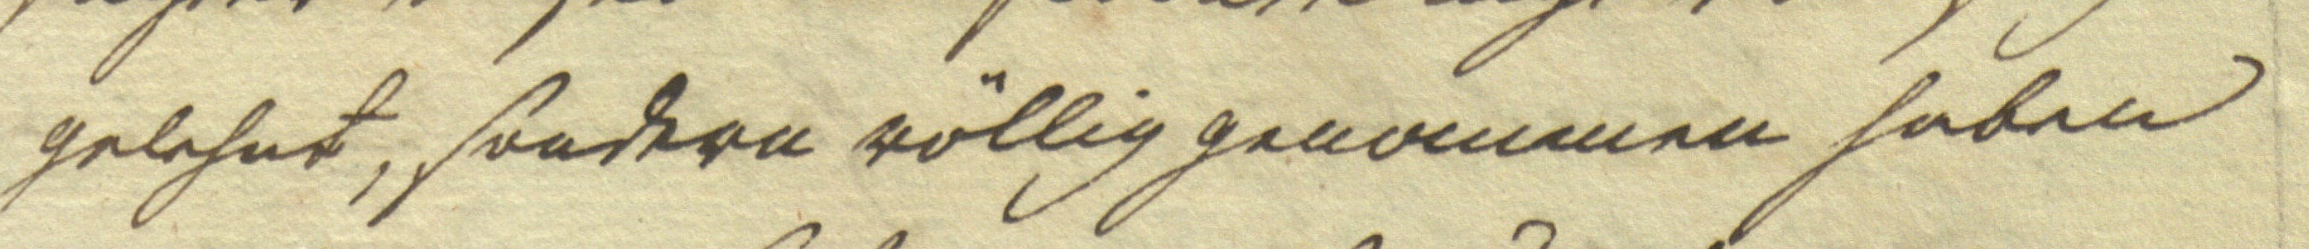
gelehnt, sondern völlig genommen haben
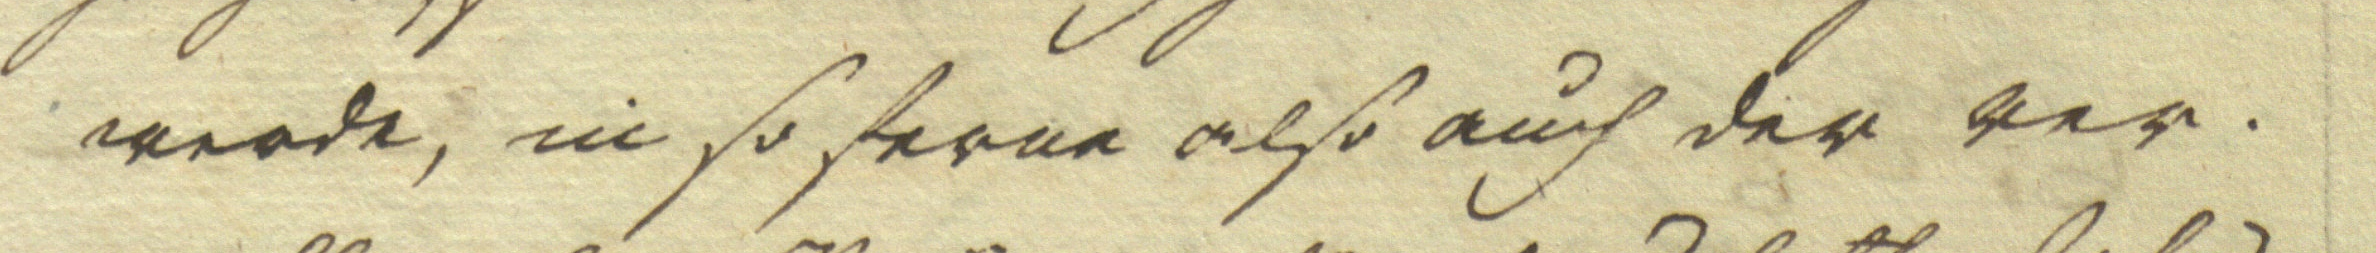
werde, in so ferne also auch der ver¬
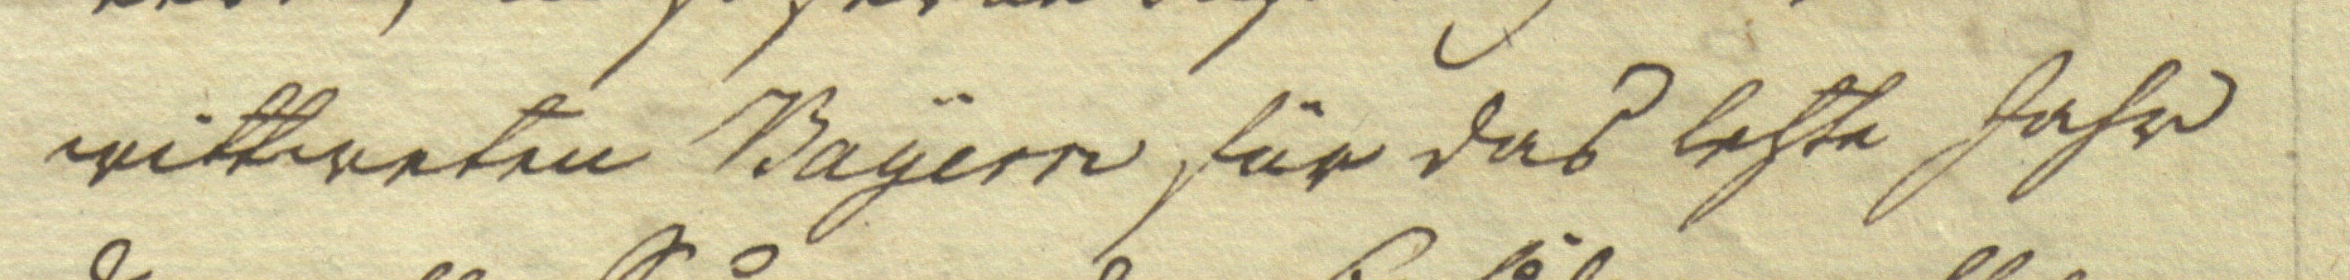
wittweten Baÿern für das letzte Jahr
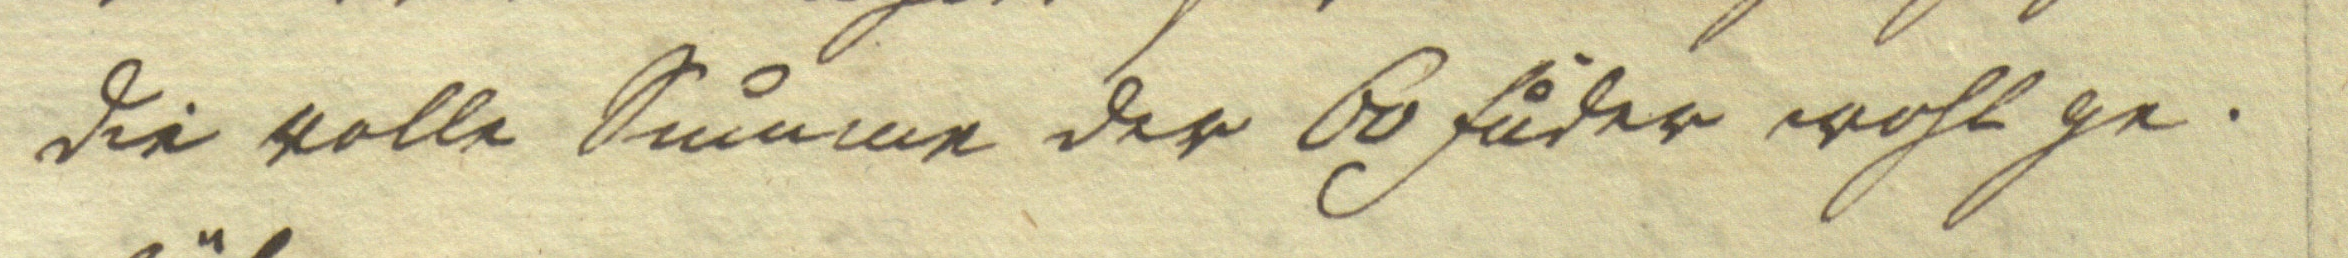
die volle Summe der 60 Fuder wohl ge¬
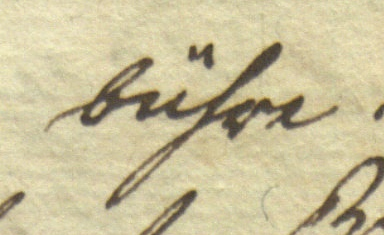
bühre.
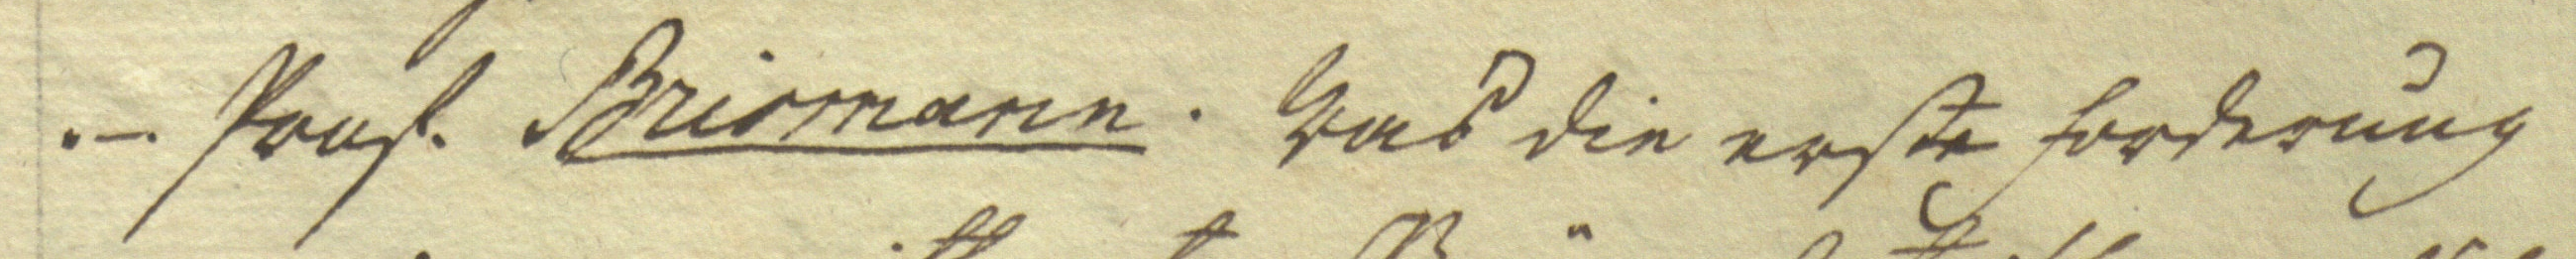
Prof. Brismann. Was die erste Forderung
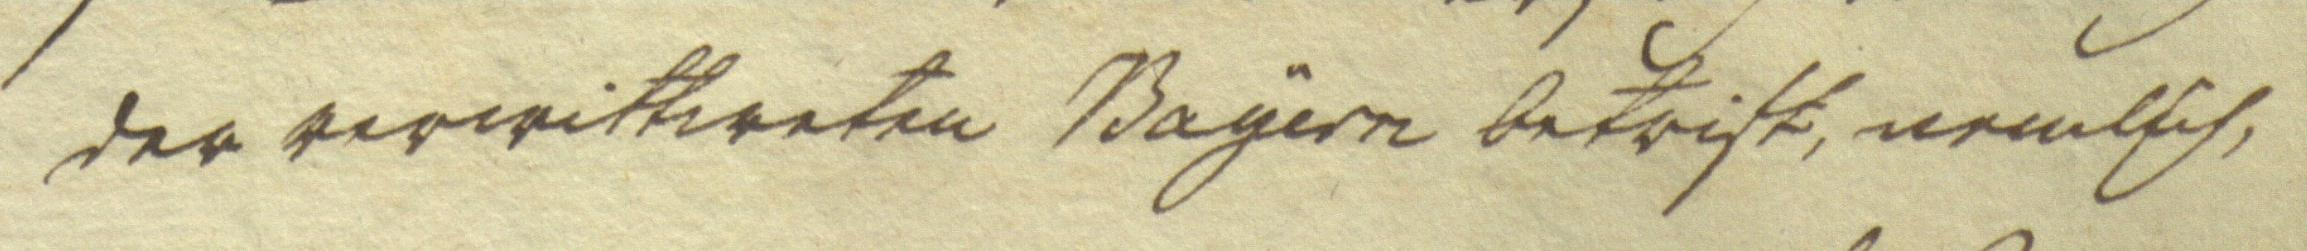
der verwittweten Baÿern betrift, nemlich,
